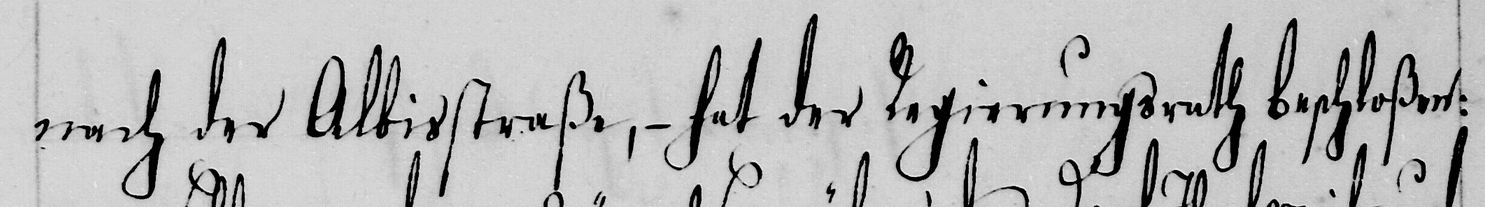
nach der Albisstraße, – hat der Regierungsrath beschloßen:
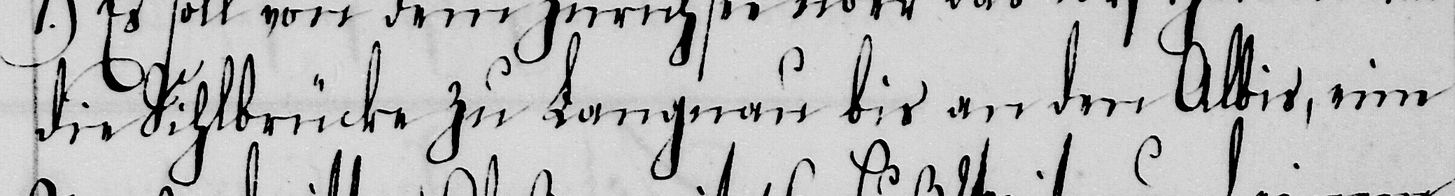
die Sihlbrücke zu Langnau bis an den Albis, eine
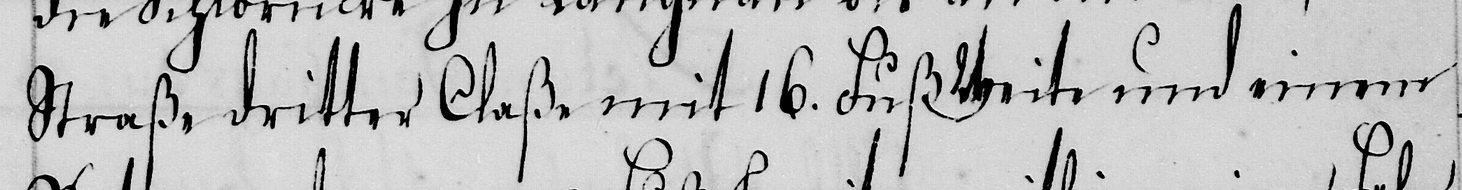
Straße dritter Claße mit 16. Fuß Weite und einem
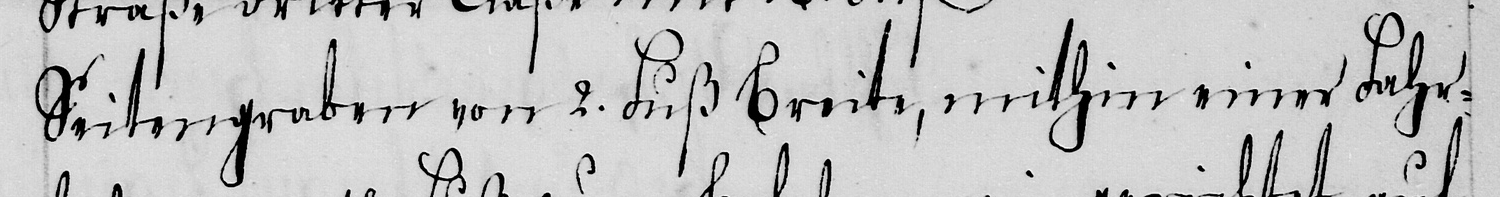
Seitengraben von 2. Fuß Breite, mithin einer Fahr¬
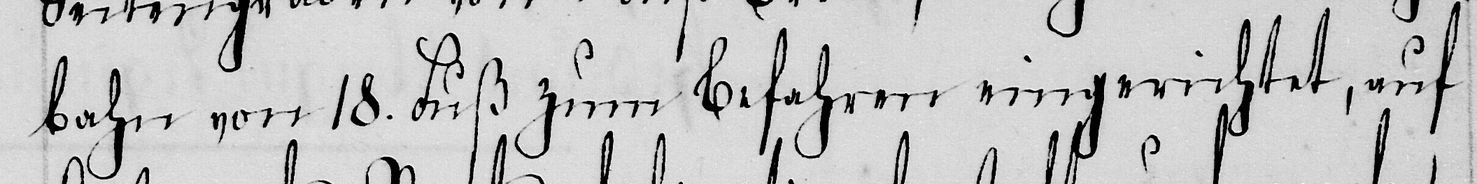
bahn von 18. Fuß zum Befahren eingerichtet, auf
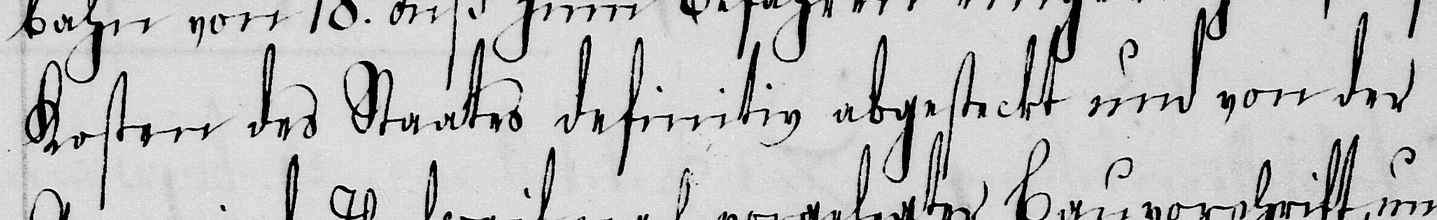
Kosten des Staates definitiv abgesteckt und von der
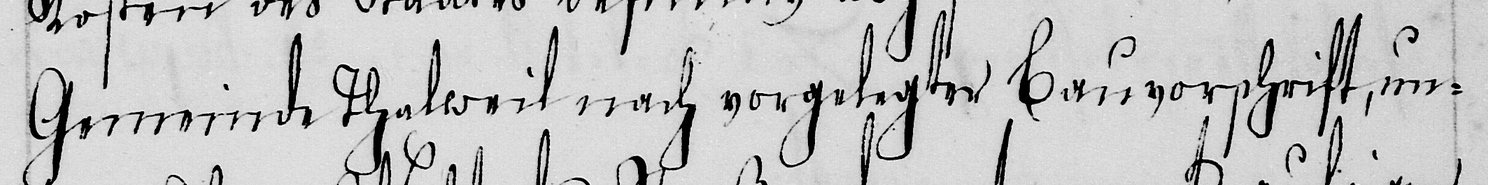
Gemeinde Thalweil nach vorgelegter Bauvorschrift, un¬
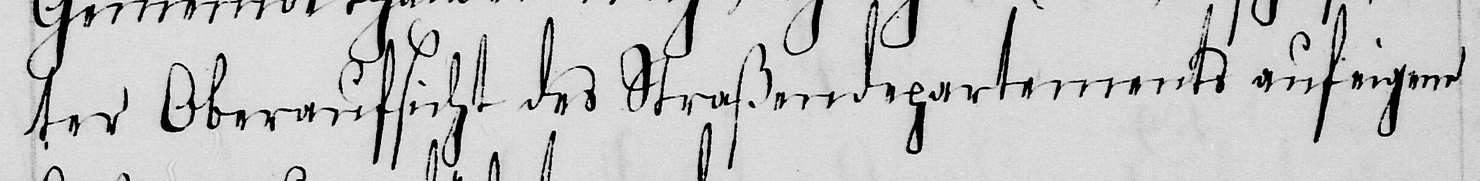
ter Oberaufsicht des Straßendepartements auf eigene
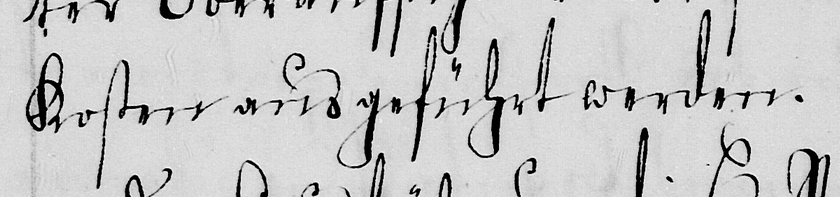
Kosten ausgeführt werden.
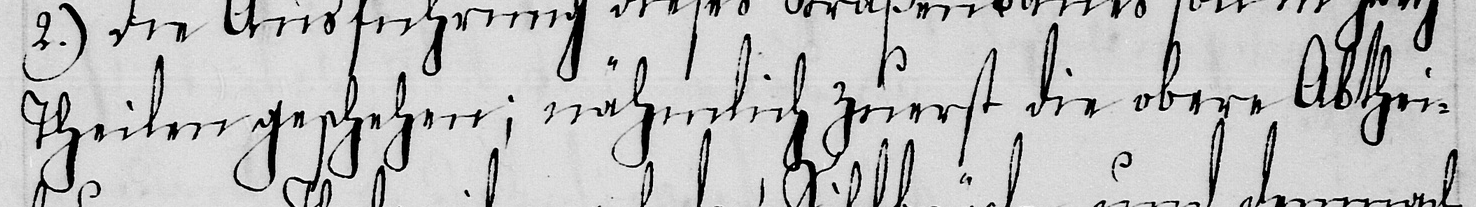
Theilen geschehen; nähmlich zuerst die obere Abthei¬
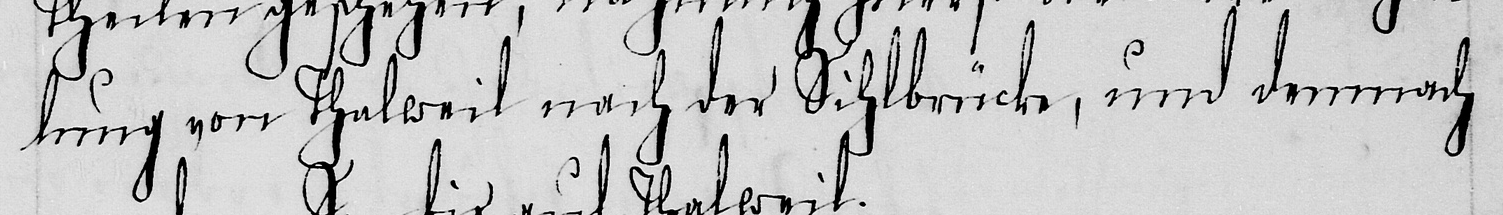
lung von Thalweil nach der Sihlbrücke, und demnach
